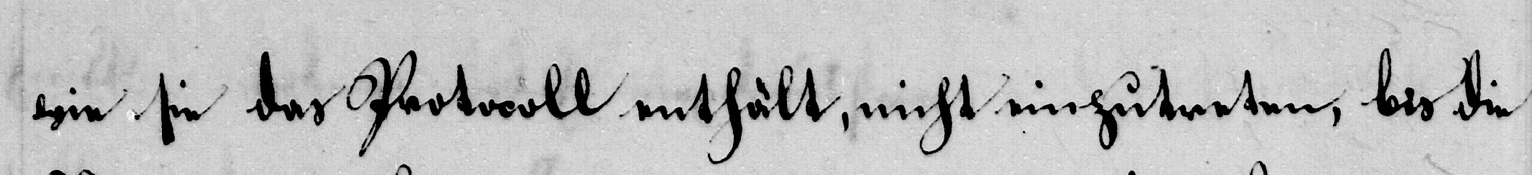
wie sie das Protocoll enthält, nicht einzutreten, bis die
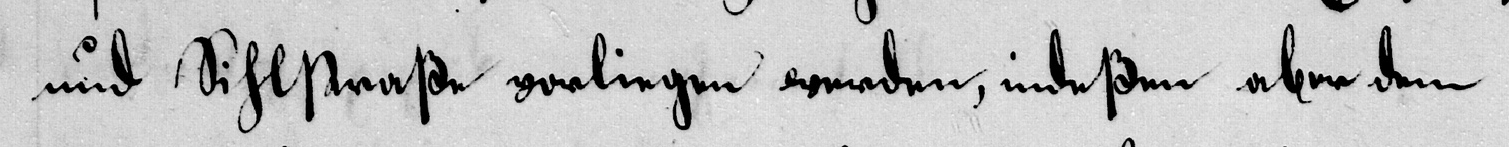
und Sihlstraße vorliegen werden, indeßen aber dem
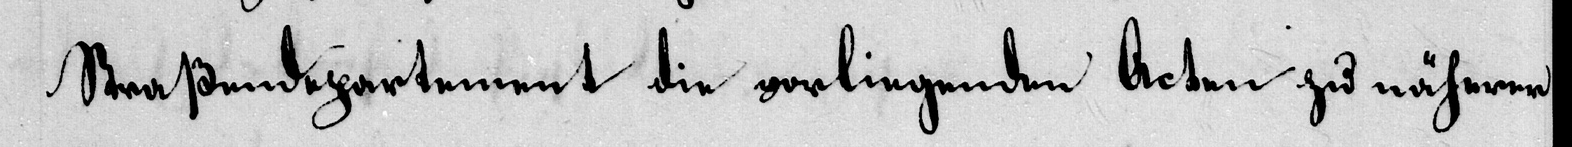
Straßendepartement die vorliegenden Acten zu näherer
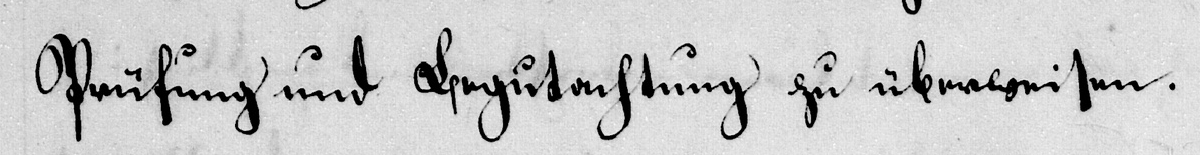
Prüfung und Begutachtung zu überweisen.
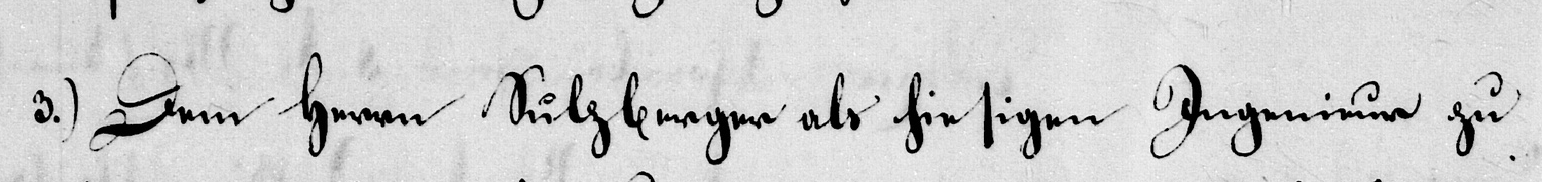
3.) Dem Herrn Sulzberger als hiesigen Ingenieur zu
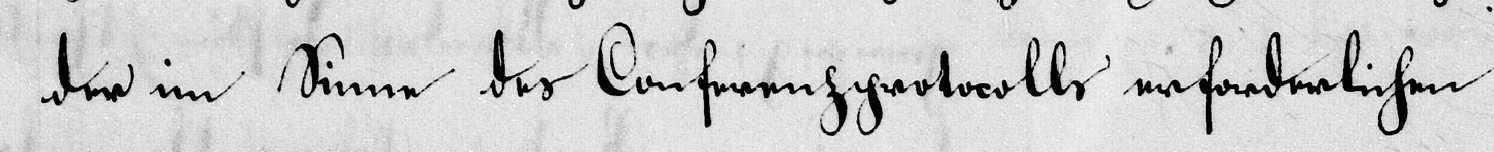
der im Sinne des Conferenzprotocolls erforderlichen
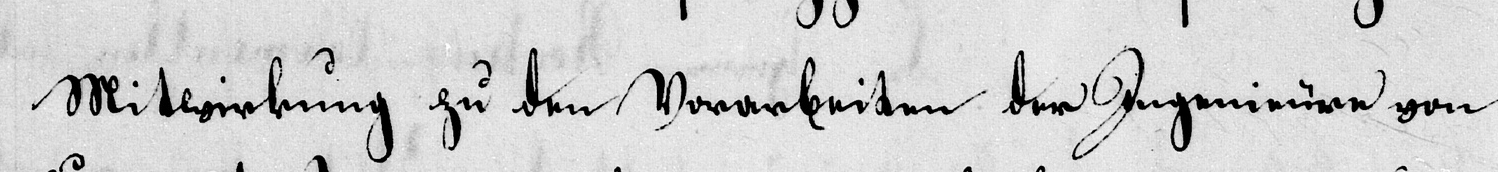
Mitwirkung zu den Vorarbeiten der Ingenieure von
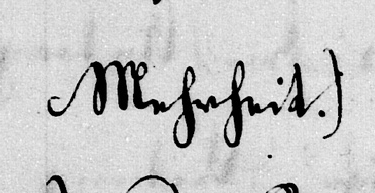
Mehrheit.)
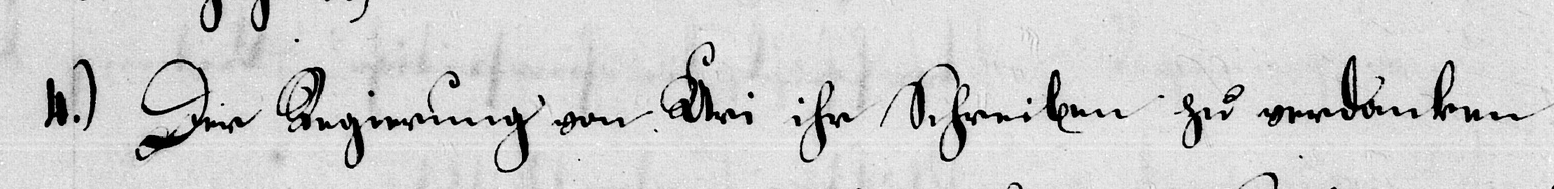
4.) Der Regierung von Uri ihr Schreiben zu verdanken
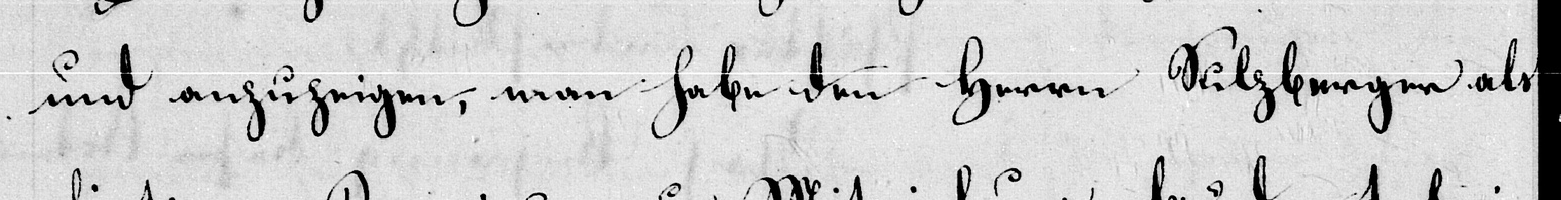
und anzuzeigen, man habe den Herrn Sulzberger als
